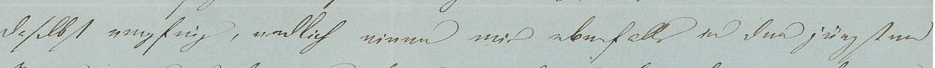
daselbst empfing, endlich einen mir ebenfalls in den jüngsten
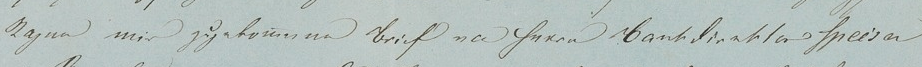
Tagen mir zugekommenen Brief von Herrn Bankdirektor Speiser
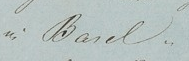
in Basel.
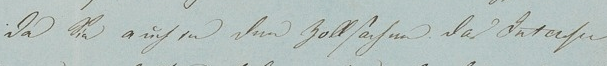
Da Sie auch in den Zollsachen das Interesse
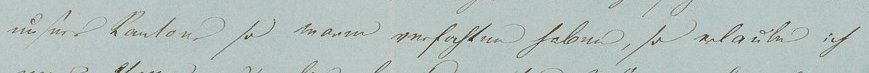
unsers Kantons so warm verfochten haben, so erlaube ich
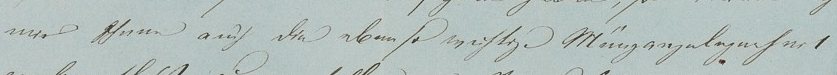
mir Ihnen auch die ebenso wichtige Münzangelegenheit
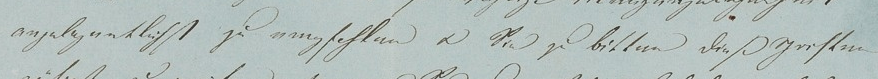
angelegentlichst zu empfehlen u Sie zu bitten dieß Schriften
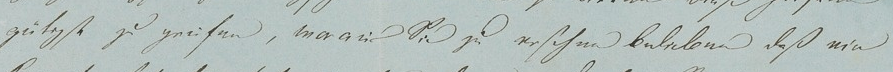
gütigst zu greifen, woraus Sie zu ersehen belieben daß ein
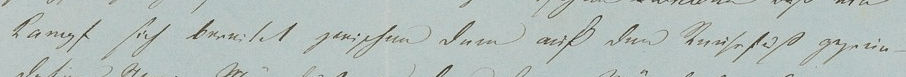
Kampf sich bereitet zwischen dem auf dem Reichsfuß gegrün-
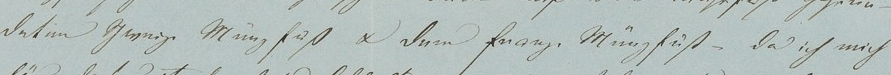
detenSchweiz. Münzfuß & dem franz. Münzfuß. Da ich mich
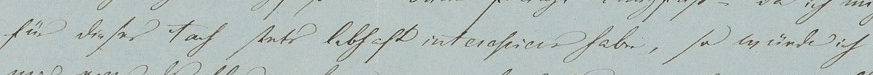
für dieses Fach stets lebhaft interessiert habe, so würde ich
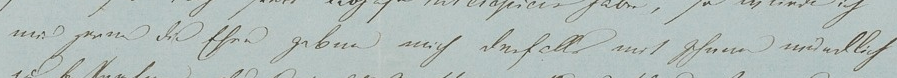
mir gerne die Ehre geben mich desfalls mit Ihnen mündlich
